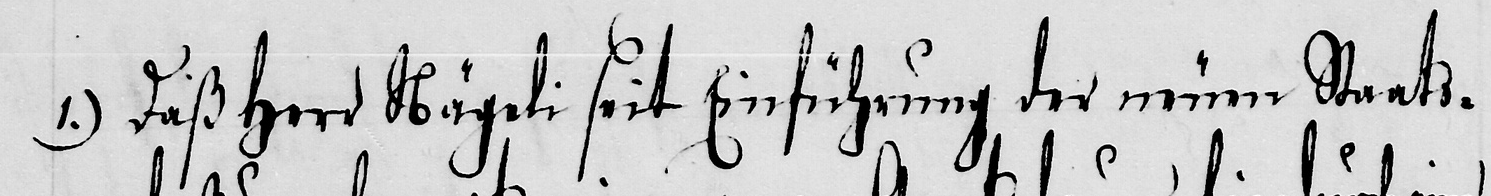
1.) Daß Herr Nägeli seit Einführung der neuen Staats¬
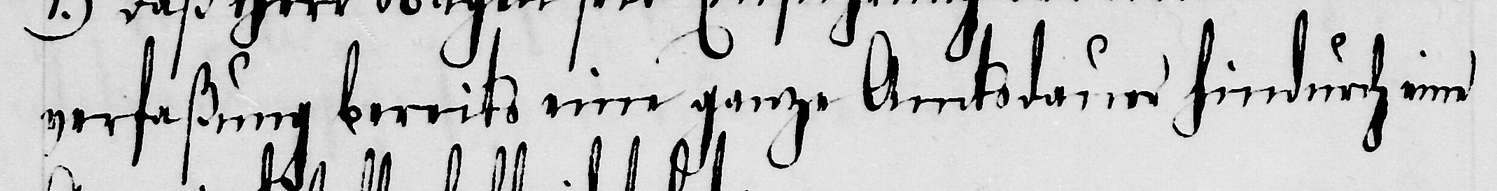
verfaßung bereits eine ganze Amtsdauer hindurch eine
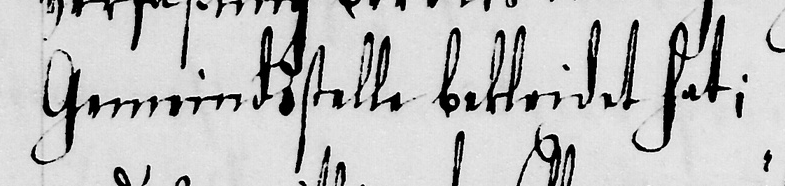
Gemeindsstelle bekleidet ha¬
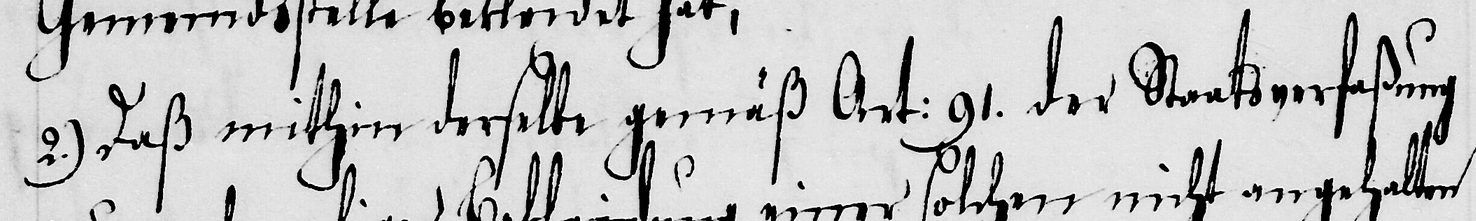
2.) Daß mithin derselbe gemäß Art: 91. der Staatsverfaßung
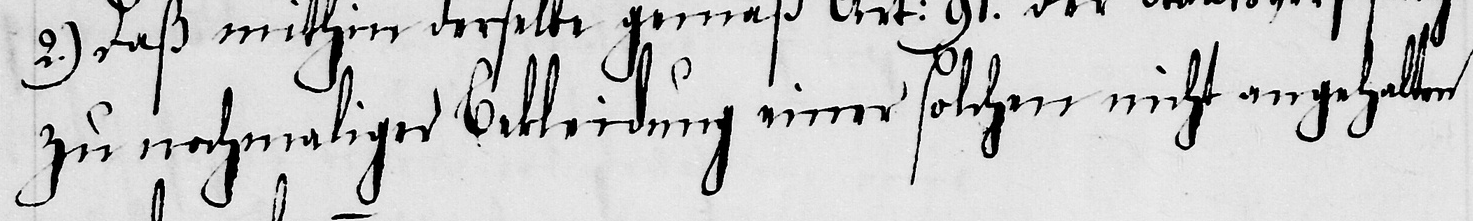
zu nochmaliger Bekleidung einer solchen nicht angehalten
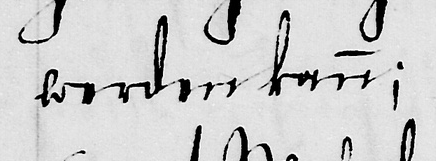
werden kann;
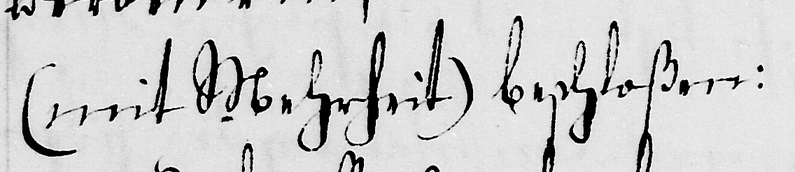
(mit Mehrheit) beschloßen:
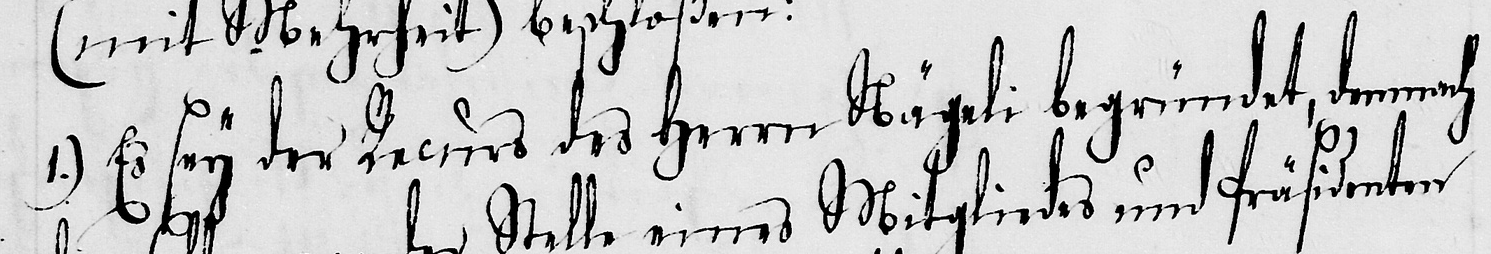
1.) Es sey der Recurs des Herrn Nägeli begründet, demna¬
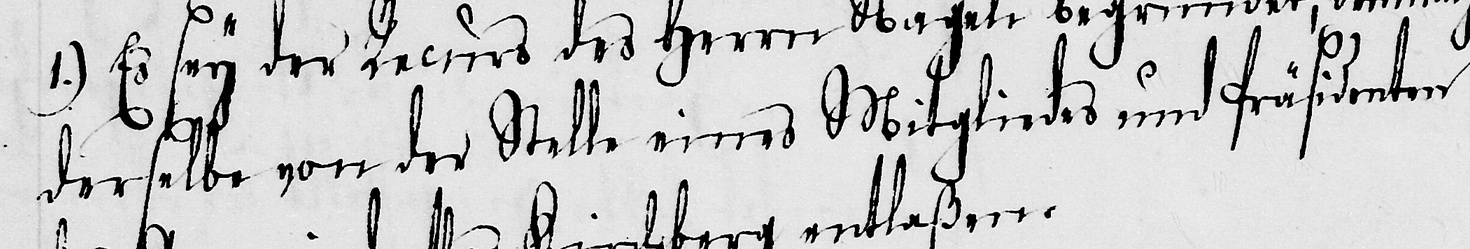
derselbe von der Stelle eines Mitgliedes und Präsidenten
